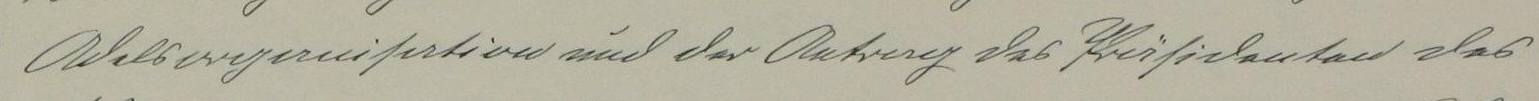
Adelsorganisation und der Antrag des Präsidenten des
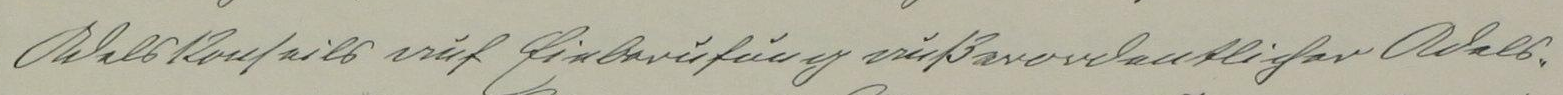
Adelskonseils auf Einberufung außerordentlicher Adels-
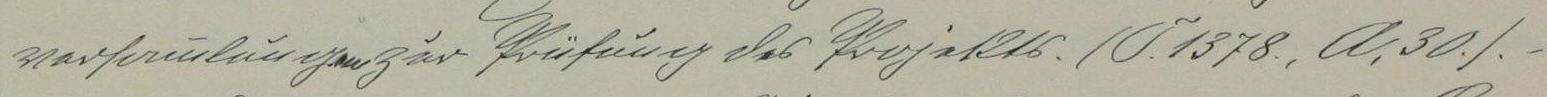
versammlungenen zur Prüfung des Projekts (T.1378; A.30).
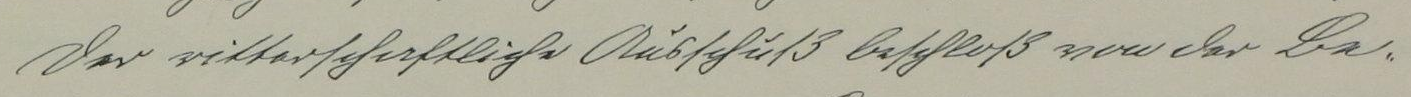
Der ritterschaftliche Ausschuß beschloß von der Be-
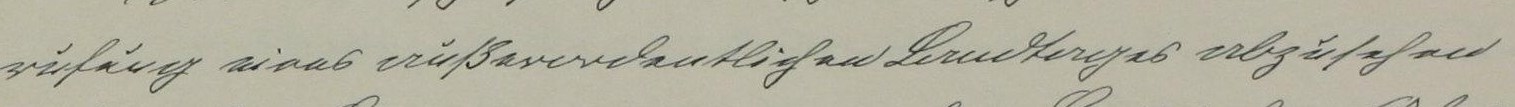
rufung eines außerordentlichen Landtages abzusehen
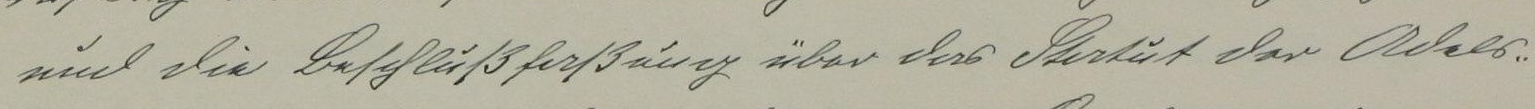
und die Beschlußfaßung über das Statut der Adels-
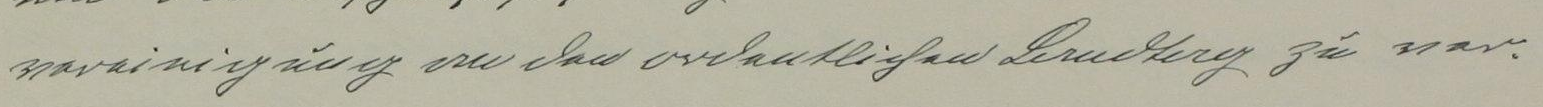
vereinigung an den ordentlichen Landtag zu ver-
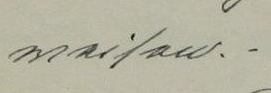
weisen.
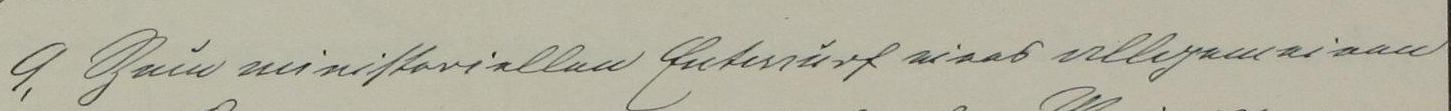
9. Zum ministeriellen Entwurf eines allgemeinen
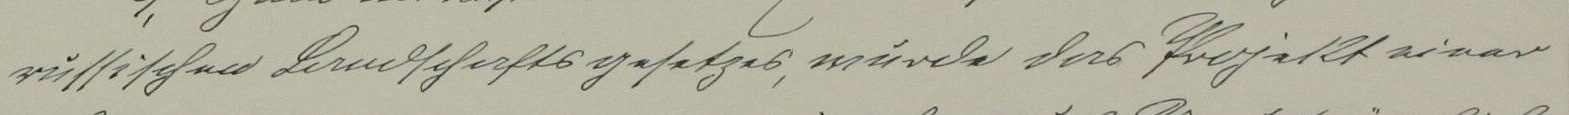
russischen Landschaftsgesetzes, wurde das Projekt einer
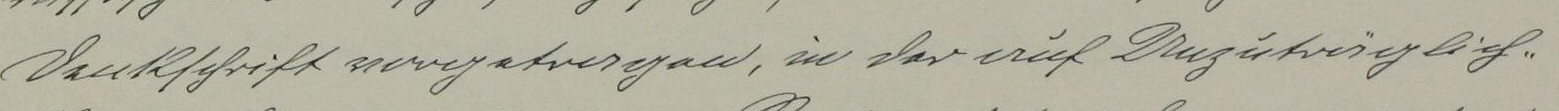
Denkschrift vorgetragen, in der auf Unzuträglich-
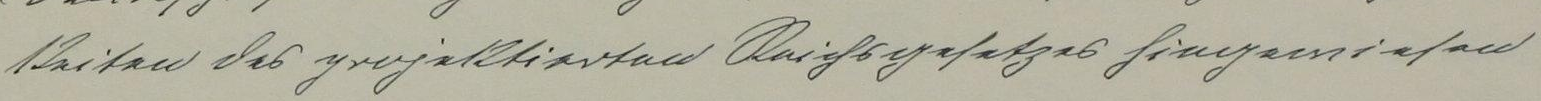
keiten des projektierten Reichsgesetzes hingewiesen
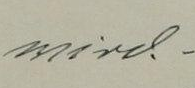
wird.
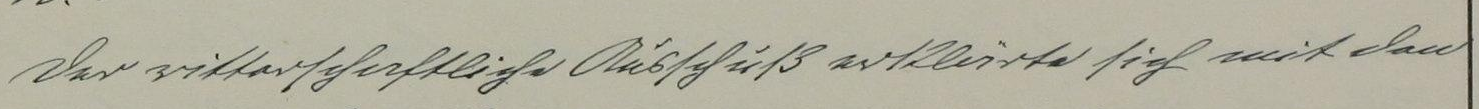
Der ritterschaftliche Ausschuß erklärte sich mit den
